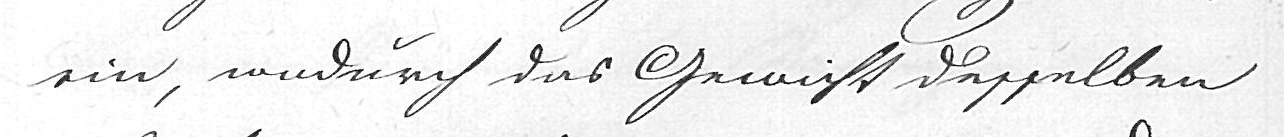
ein, wodurch das Gewicht desselben
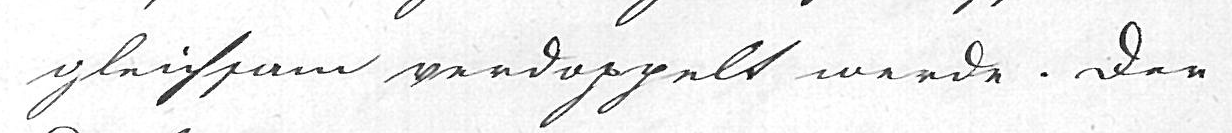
gleichsam verdoppelt werde. Der
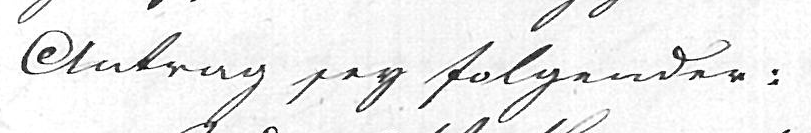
Antrag sey folgender:
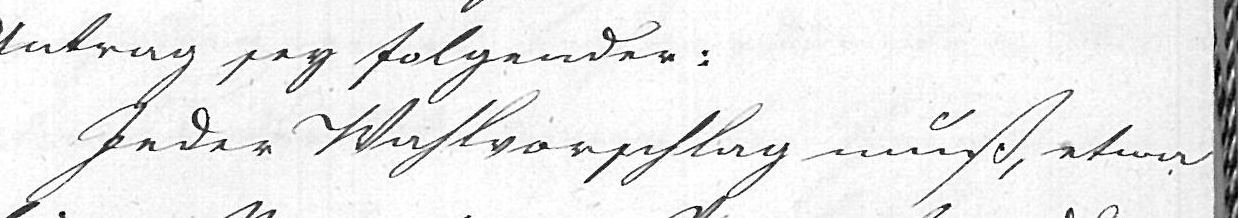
Jeder Wahlvorschlag muß, etwa
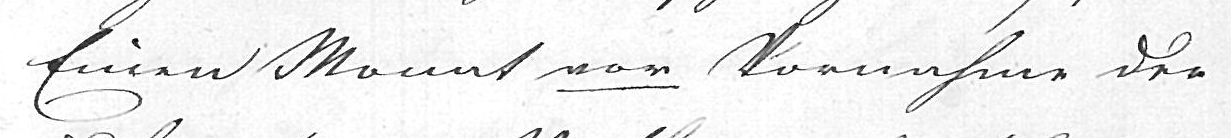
Einen Monat vor Vornahme der
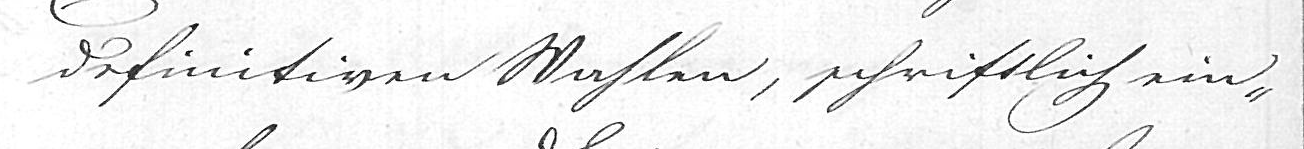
definitiven Wahlen, schriftlich ein-
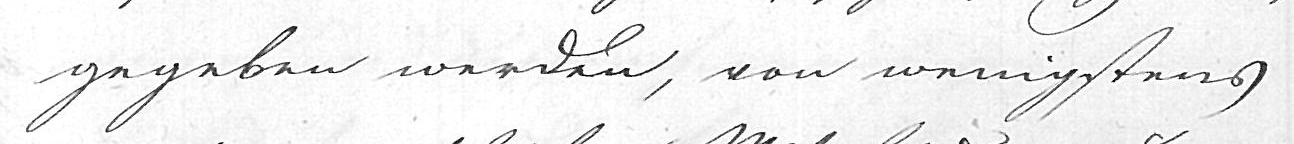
gegeben werden, von wenigstens
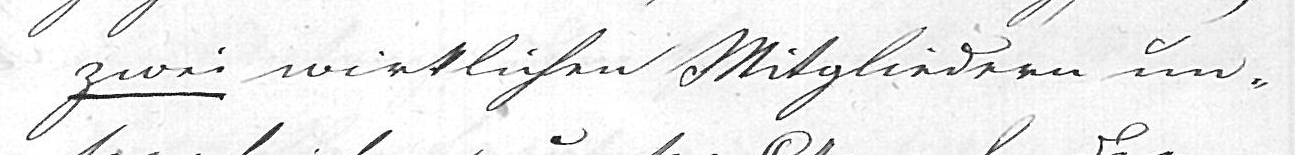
zwei wirklichen Mitgliedern un-
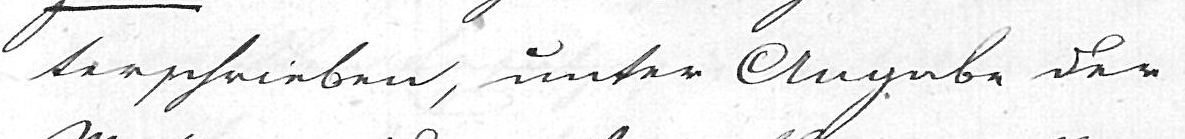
terschrieben, unter Angabe der
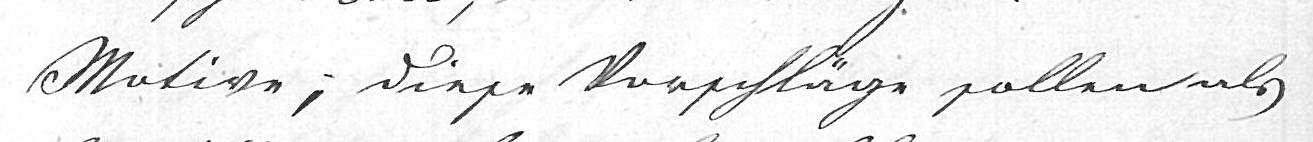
Motive; diese Vorschläge sollen als
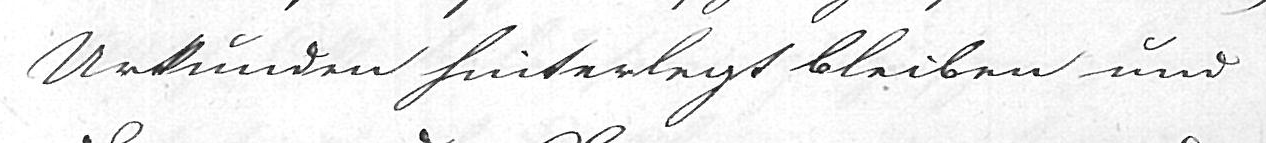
Urkunden hinterlegt bleiben und
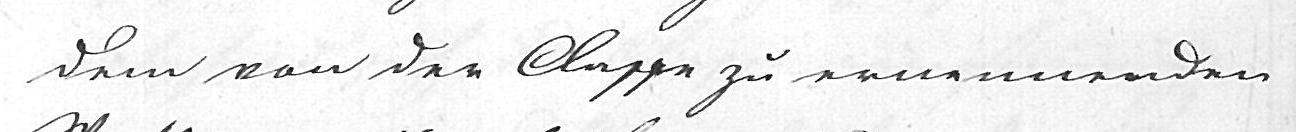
dem von der Classe zu ernennenden
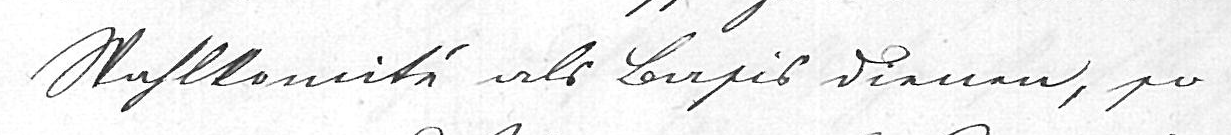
Wahlkomité als Basis dienen, so
